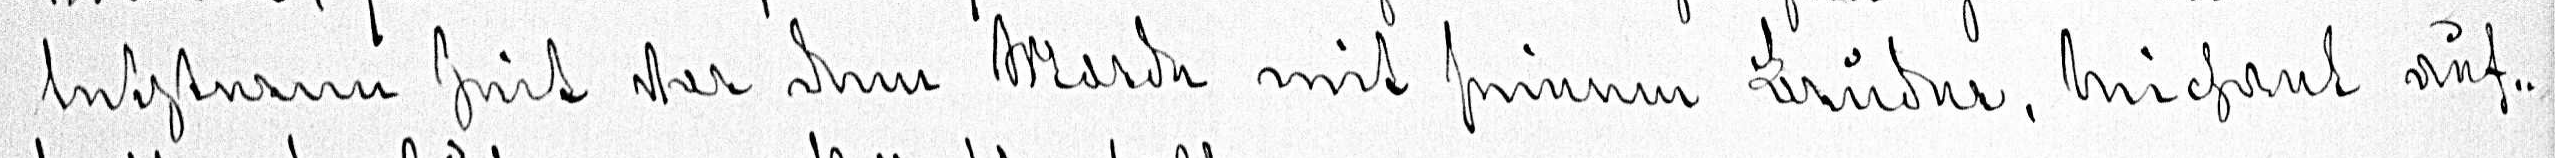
letzteren Zeit vor dem Morde mit seinem Bruder, Michael auf¬
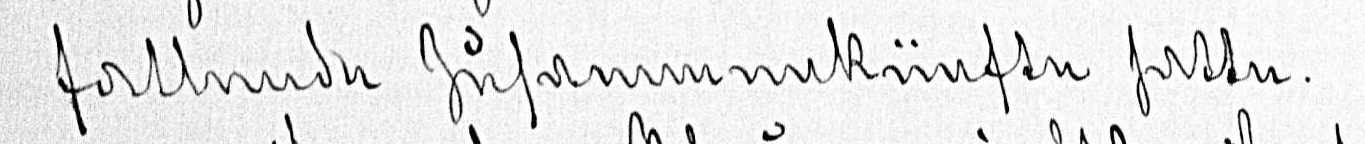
fallende Zusammenkünfte hatte.
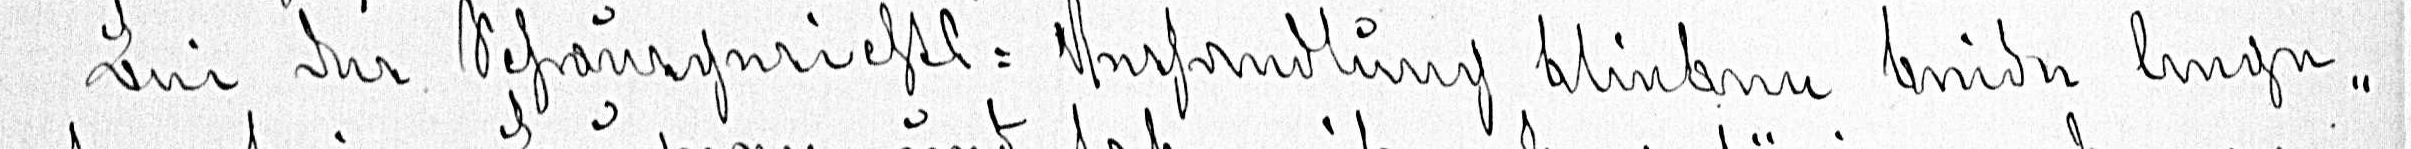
Bei der Schwurgerichts-Verhandlung blieben beide Ange¬
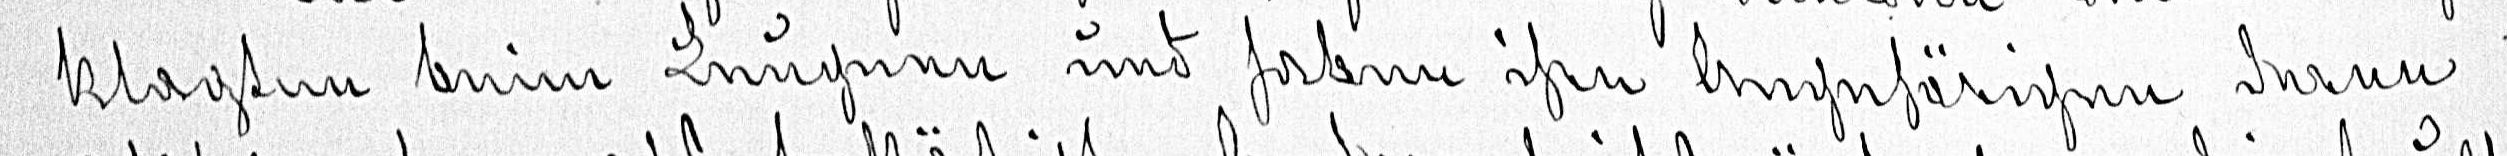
klagten beim Leugnen und haben ihre Angehörigen deren
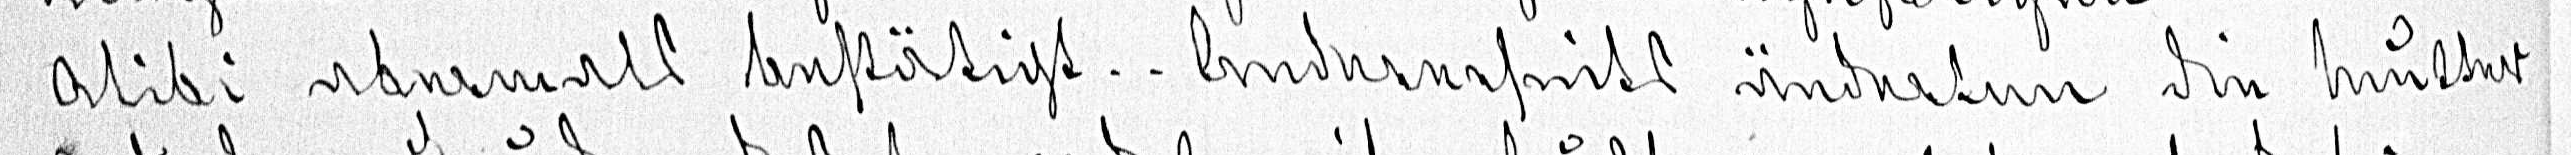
Alibi abermals bestätigt. Andererseits änderten die Mutter
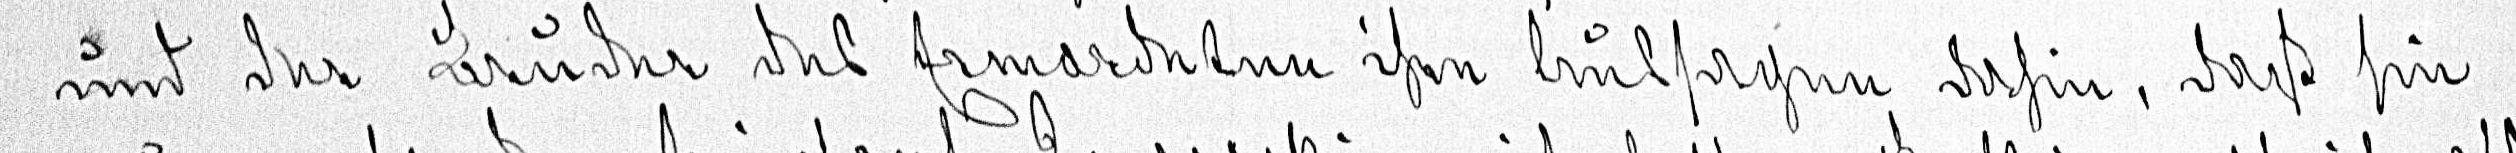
und der Bruder des Ermordeten ihre Aussagen dahin, daß sie
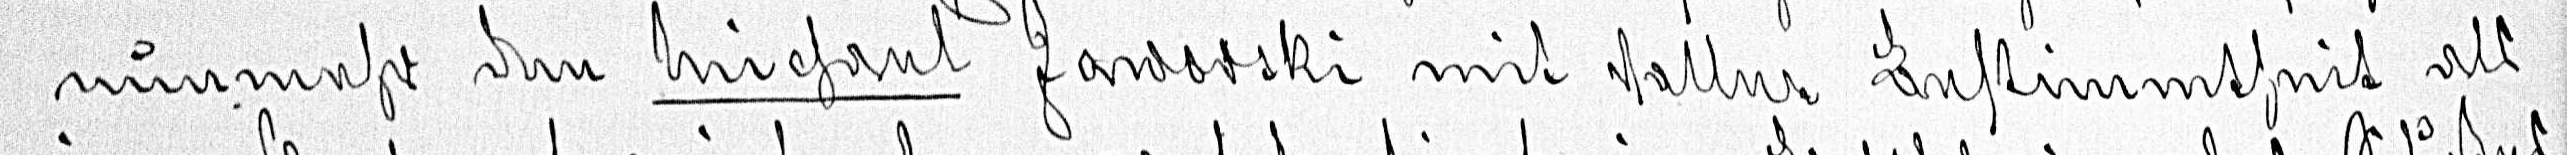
nunmehr den Michael Jaworski mit voller Bestimmtheit als
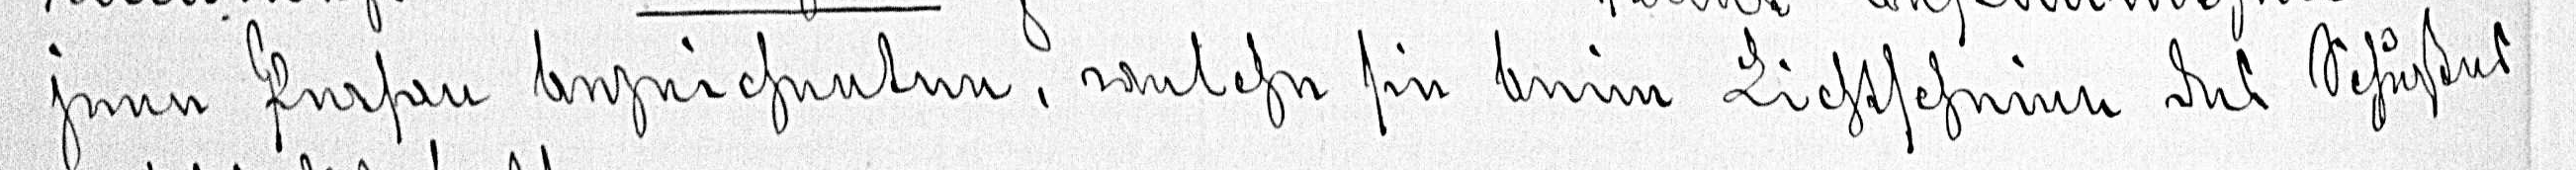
jene Person bezeichnete, welche sie beim Lichtscheine des Schußes
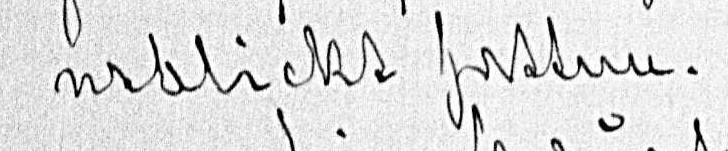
erblickt hatten.
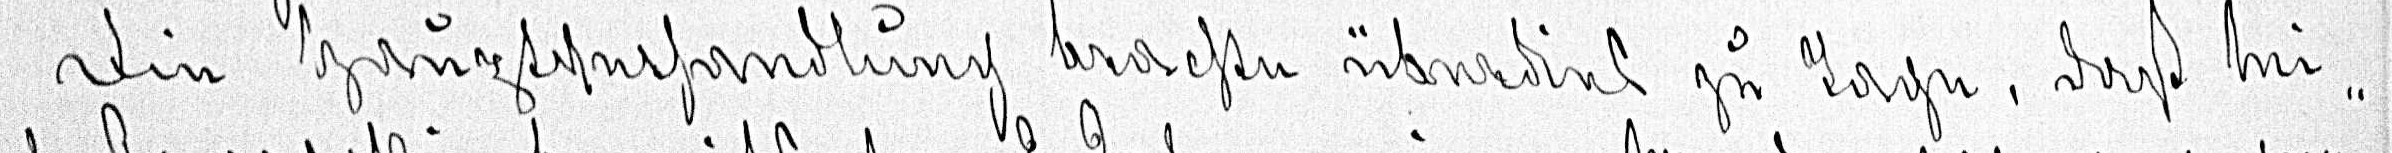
Die Hauptverhandlung brachte überdies zu Tage, daß Mi¬
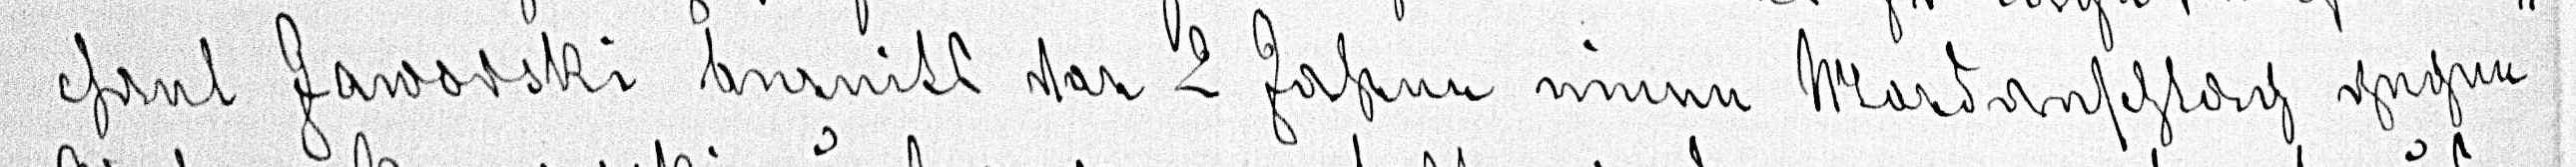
chael Jaworski bereits vor 2 Jahren einen Mordanschlag gegen
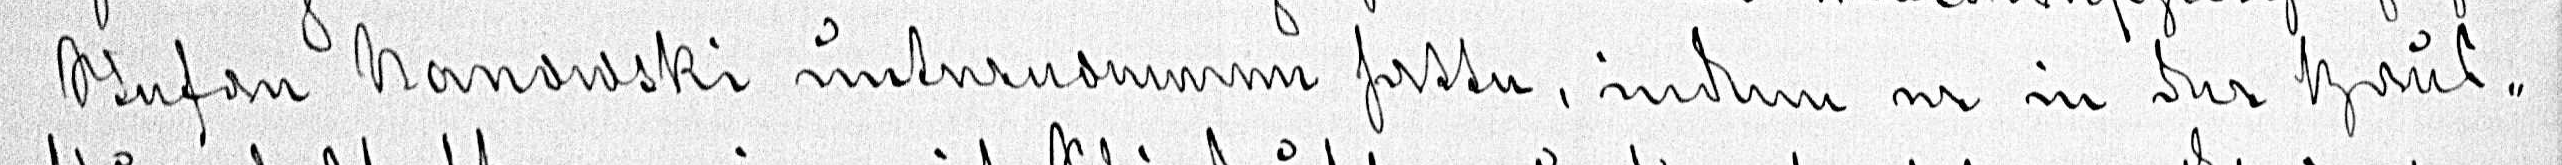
Stefan Nanowski unternommen hatte, indem er in der Haus¬
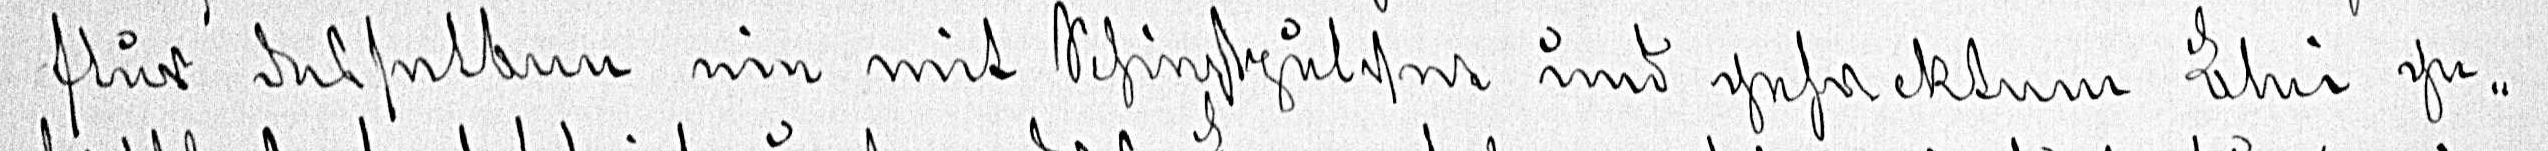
thur desselben ein mit Schußpulver und gehacktem Blei ge¬
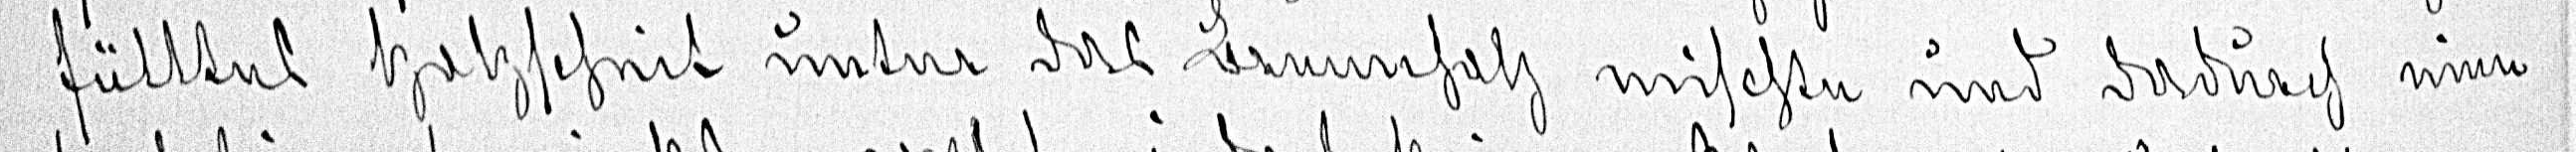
fülltes Holtzschnit unter das Brennsalz mischte und dadurch eine
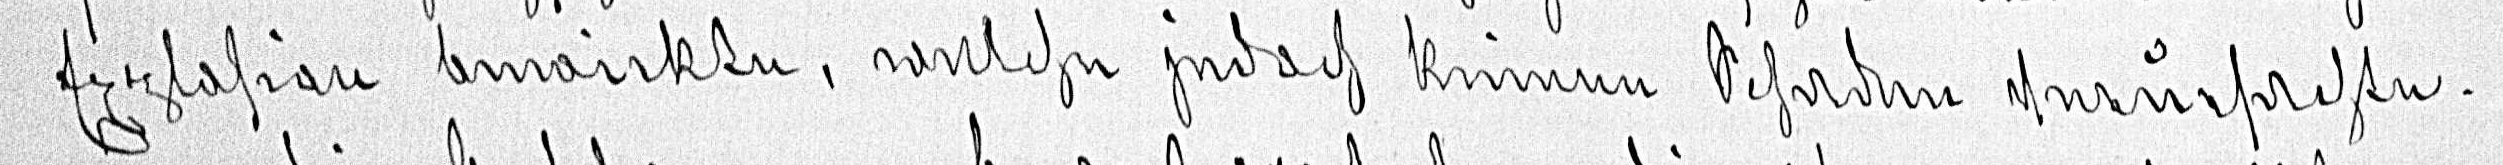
Explosion bewirkte, welche jedoch keinen Schaden verursachte.
